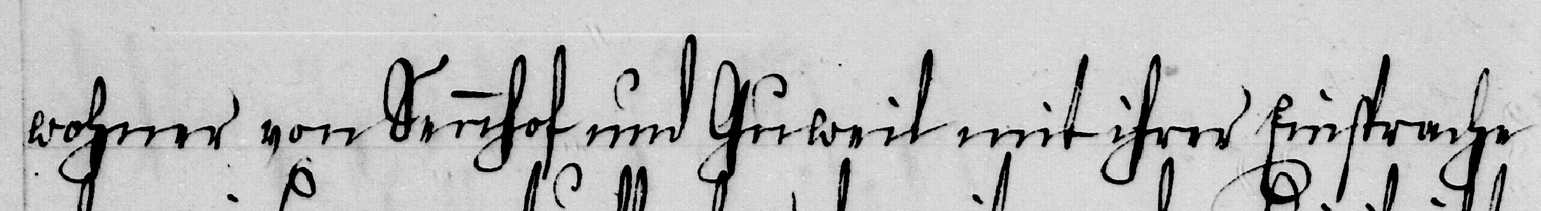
wohner von Sennhof und Guweil mit ihrer Einsprache
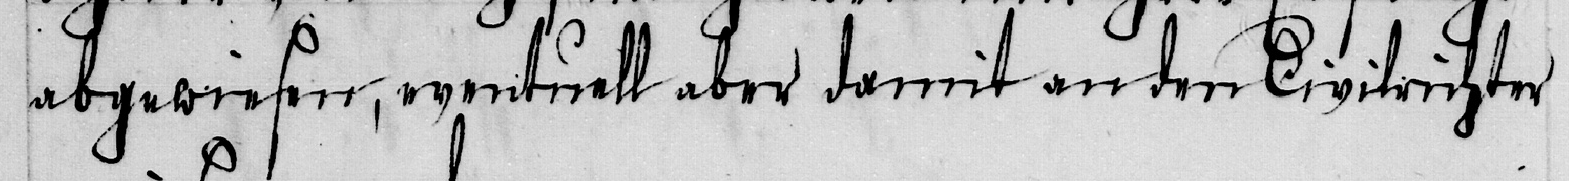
abgewiesen, eventuell aber damit an den Civilrichter
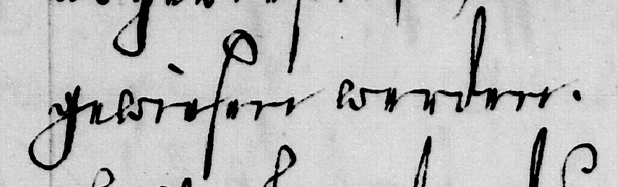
gewiesen werden.
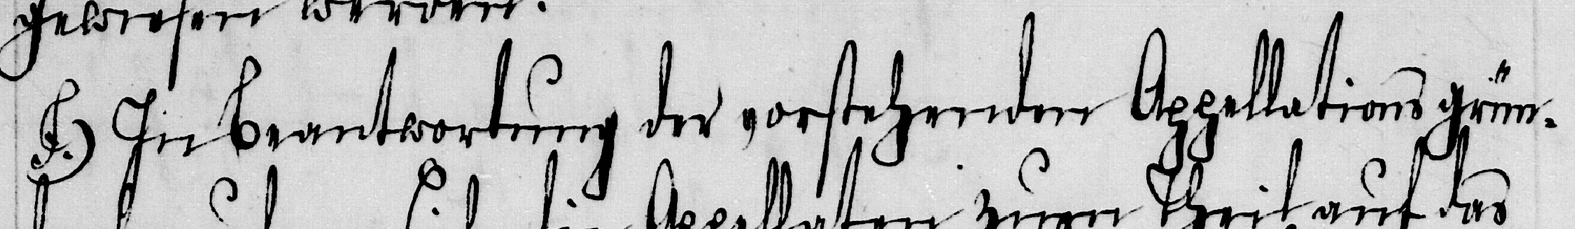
F.) In Beantwortung der vorstehenden Appellationsgrün¬
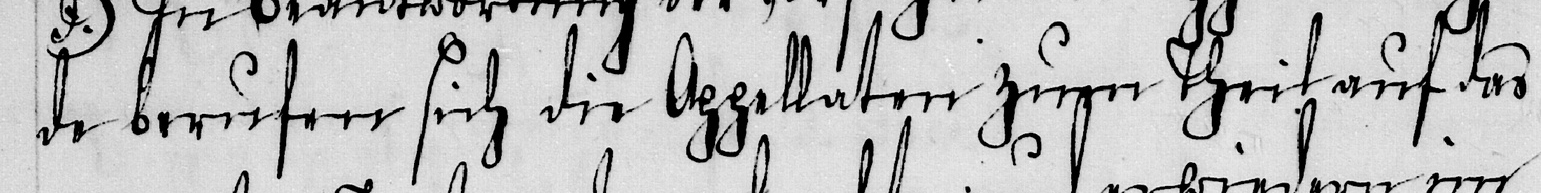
de berufen sich die Appellaten zum Theil auf das
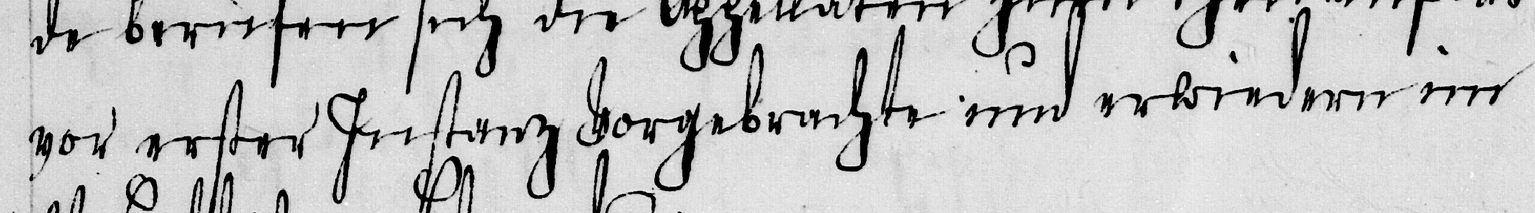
vor erster Instanz Vorgebrachte und erwiedern im
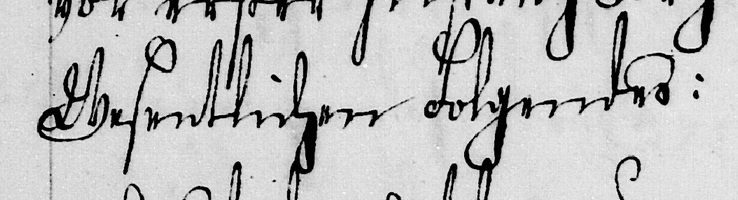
Wesentlichen Folgendes:
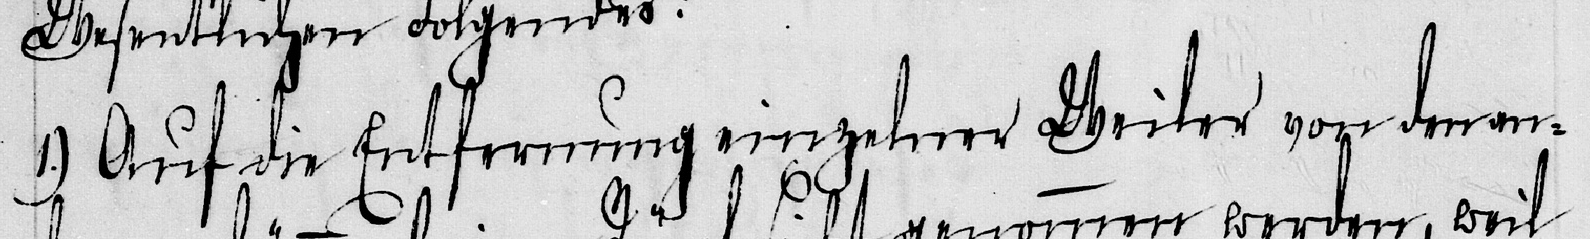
1.) Auf die Entfernung einzelner Weiler von den an¬
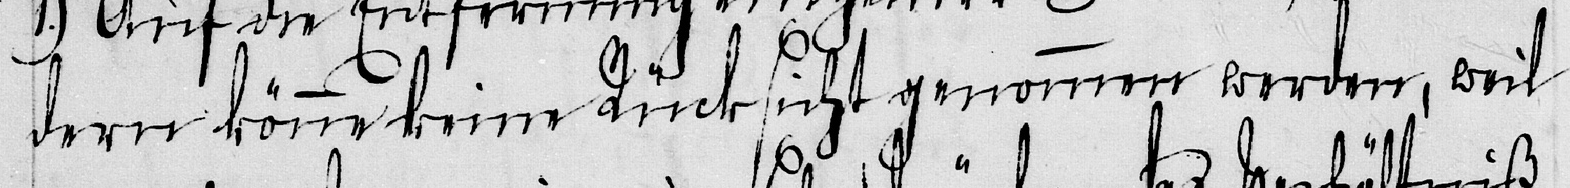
dern könne keine Rücksicht genommen werden, weil
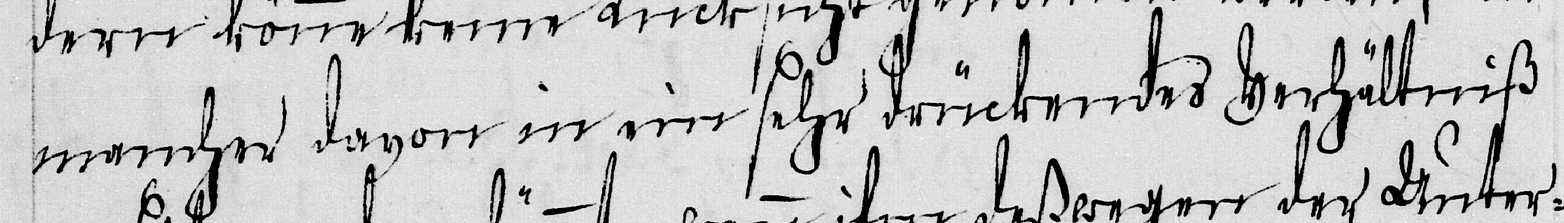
mancher davon in ein sehr drückendes Verhältniß
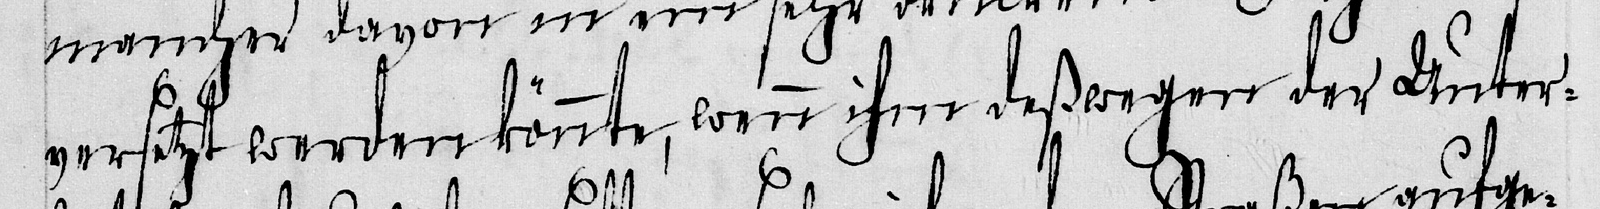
versetzt werden könnte, wenn ihm deßwegen der Unter¬
